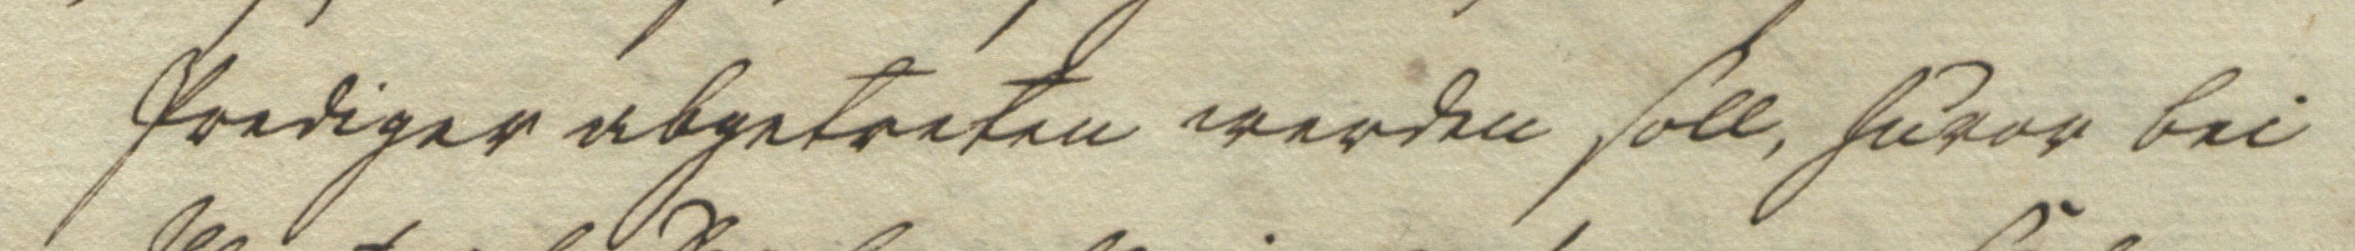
Prediger abgetreten werden soll, zuvor bei
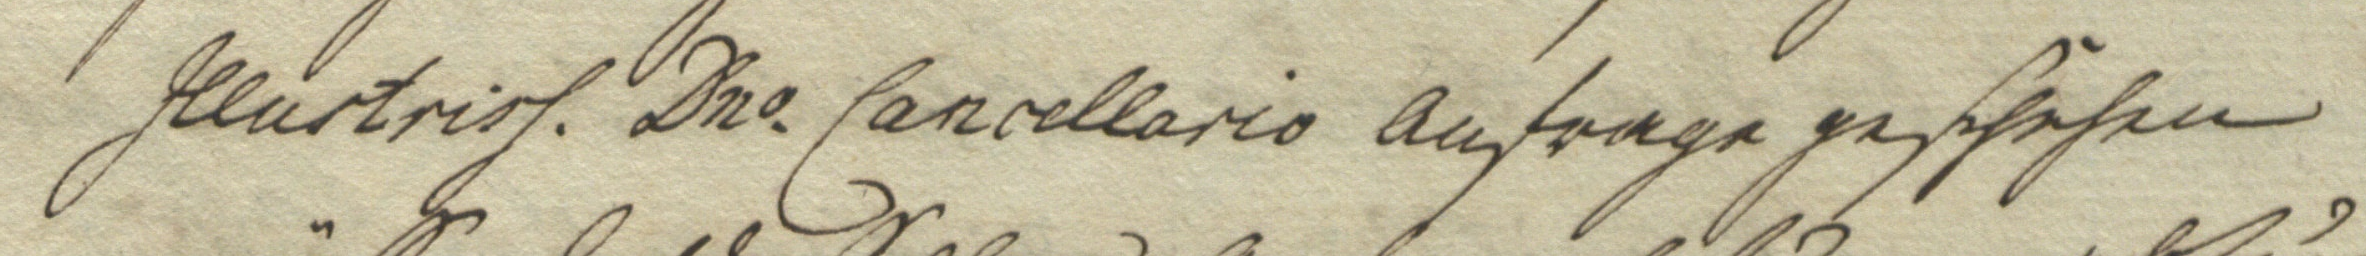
Jllustriss. Dn Cancellario Anfrage geschehen
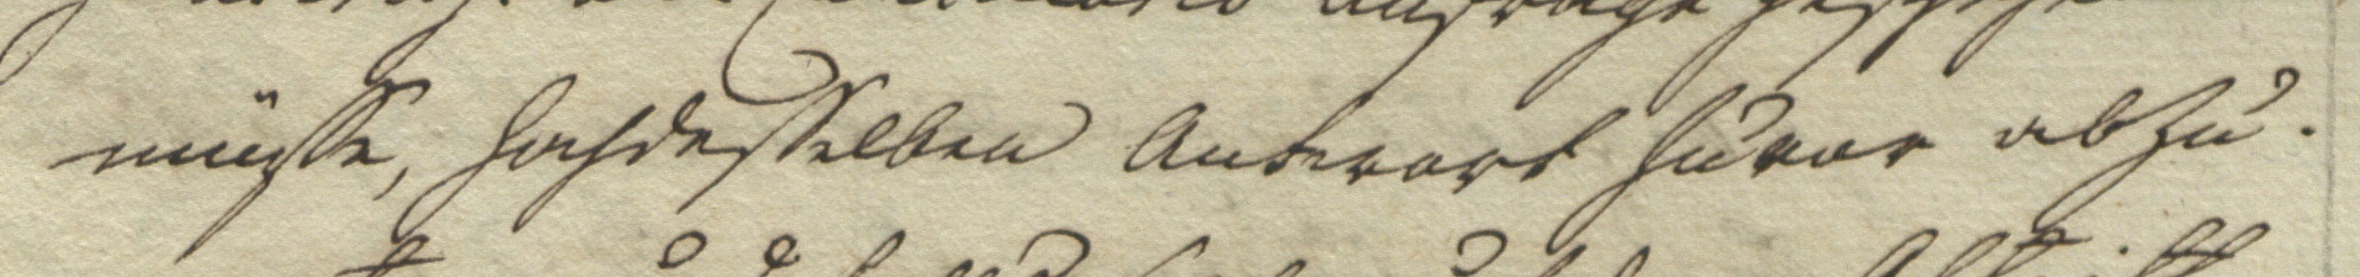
müsse, Hochdesselben Antwort zuvor abzu¬
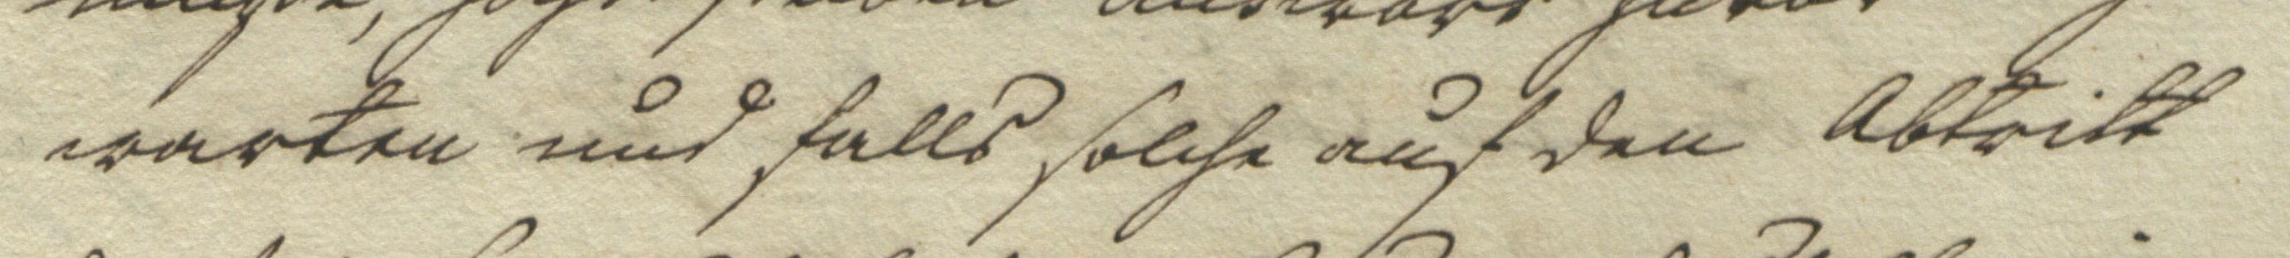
warten und falls solche auf den Abtritt
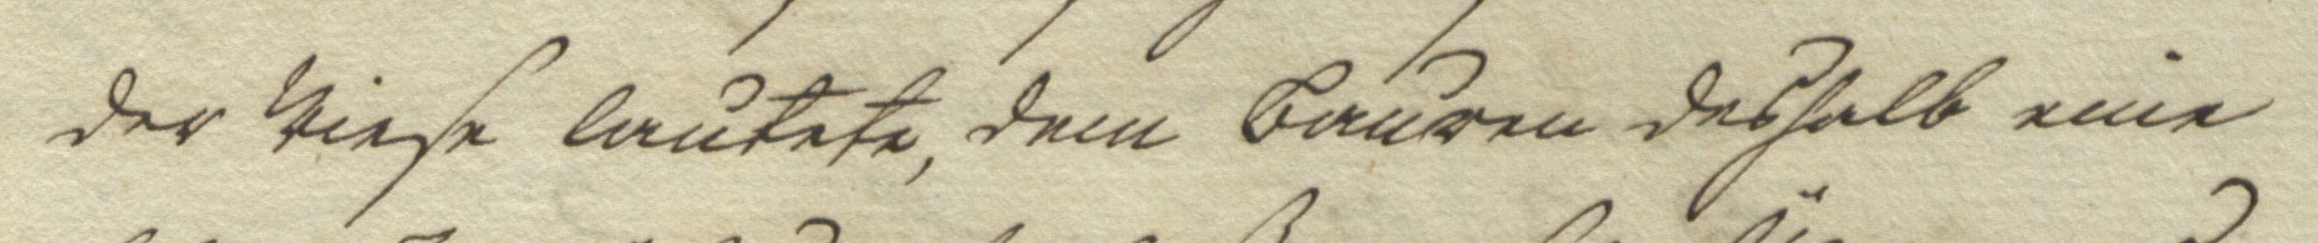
der Wiese lautete, dem Bauren deshalb eine
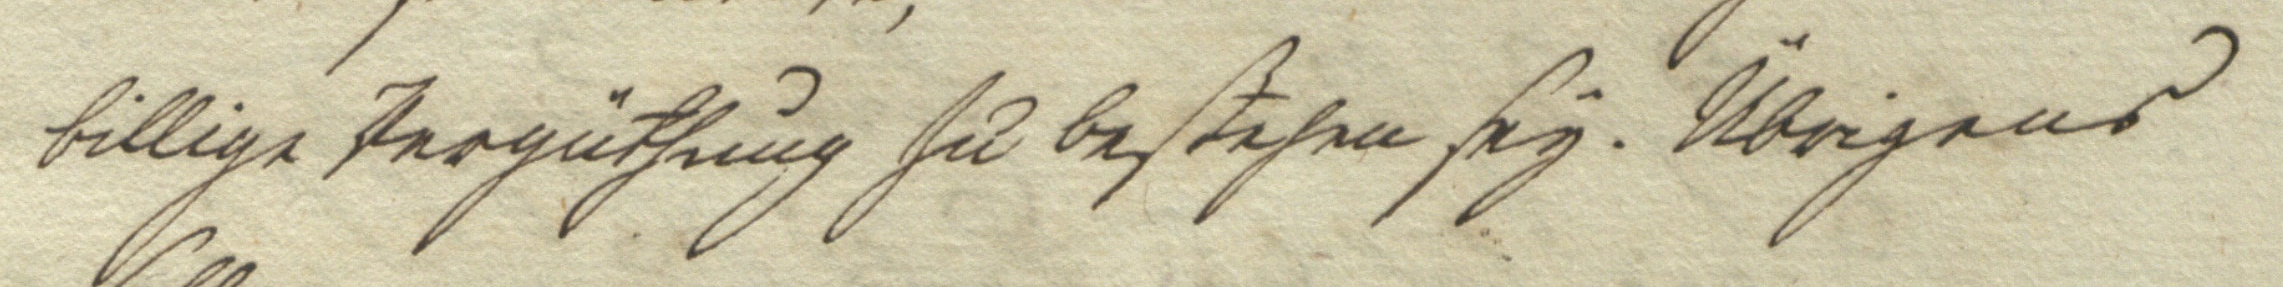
billige Vergüthung zu bestehen seÿ. Übrigens
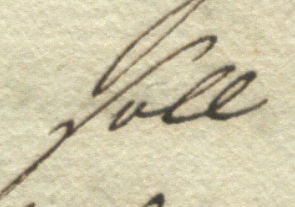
soll
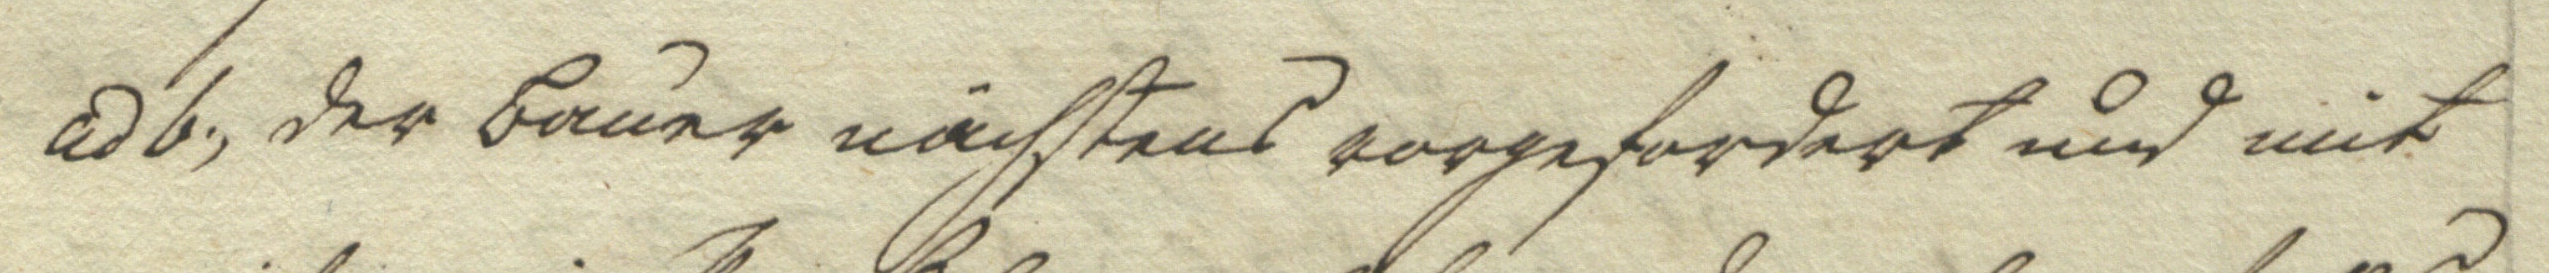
ad b., der Bauer nächstens vorgefordert und mit
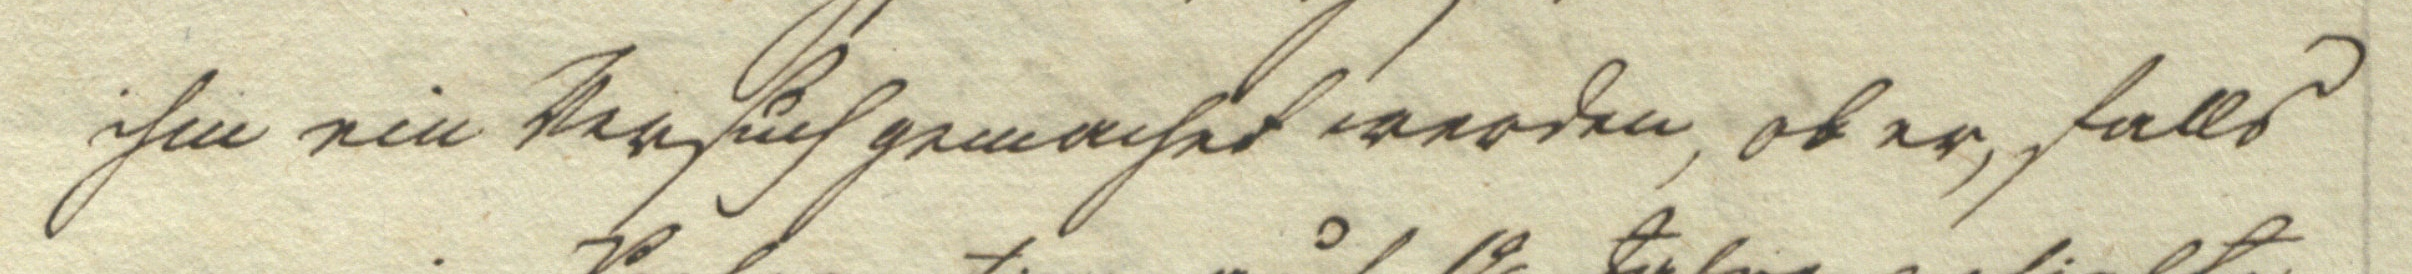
ihm ein Versuch gemachet werden, ob er, falls
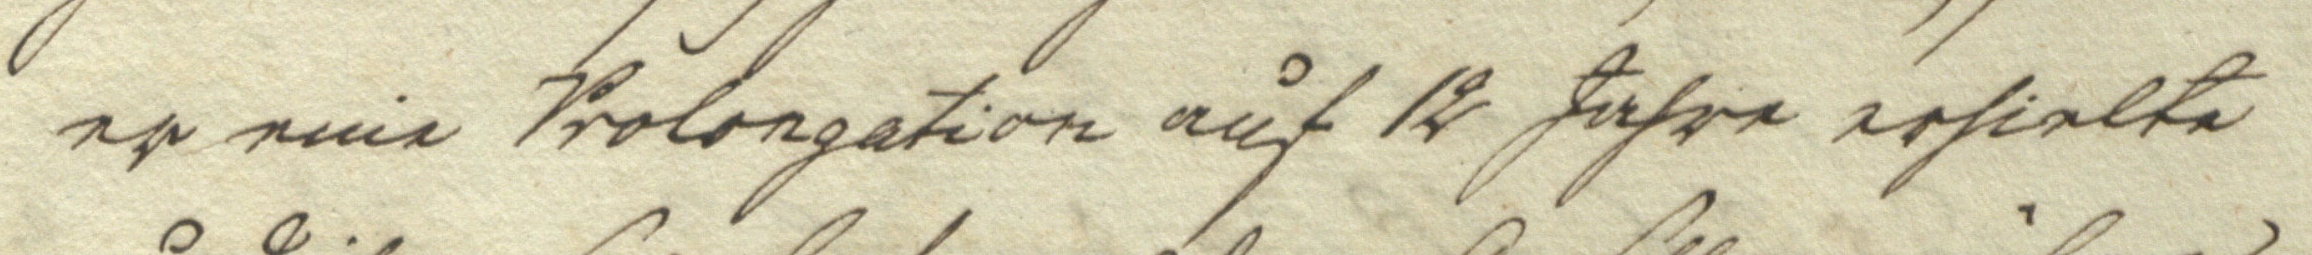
er eine Prolongation auf 12 Jahre erhielte
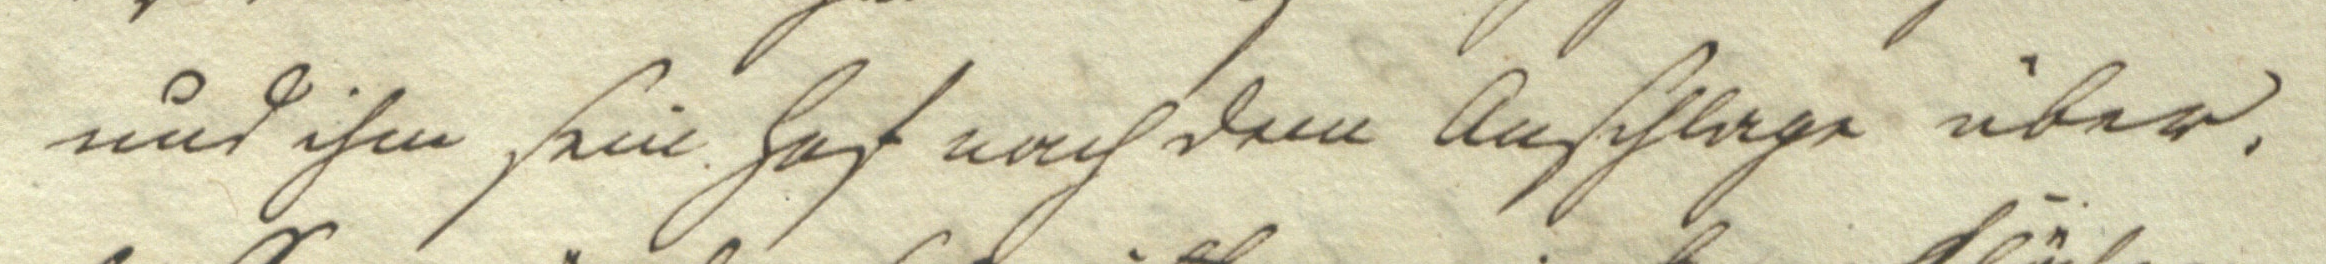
und ihm sein Hof nach dem Anschlage über¬
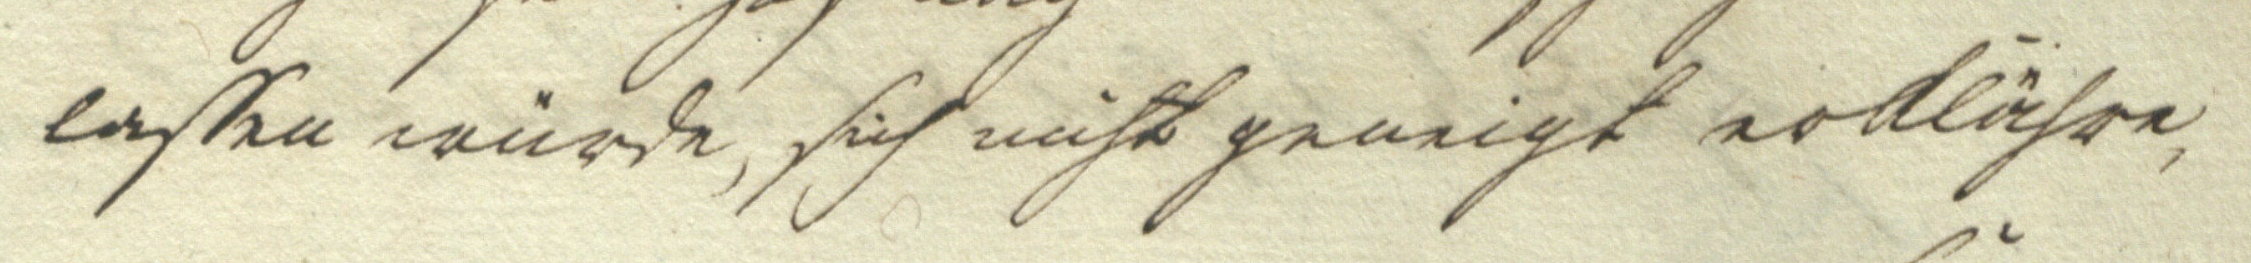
lassen würde, sich nicht geneigt erklähre,
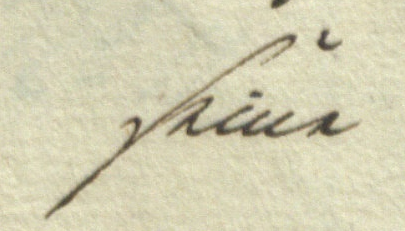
seine
